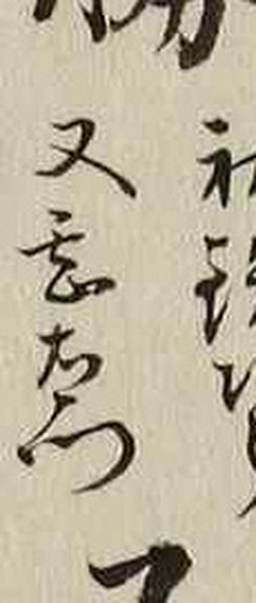又甚右衛門
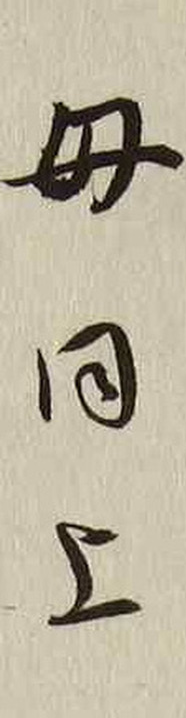母同上
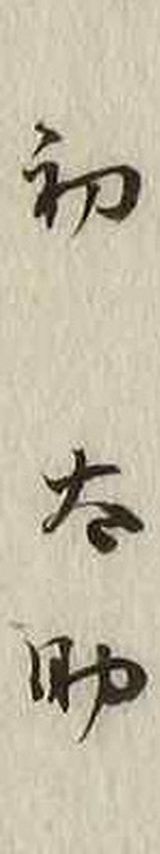初太助
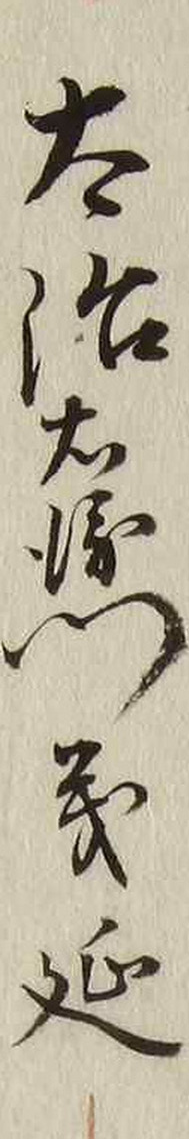太治右衛門義延
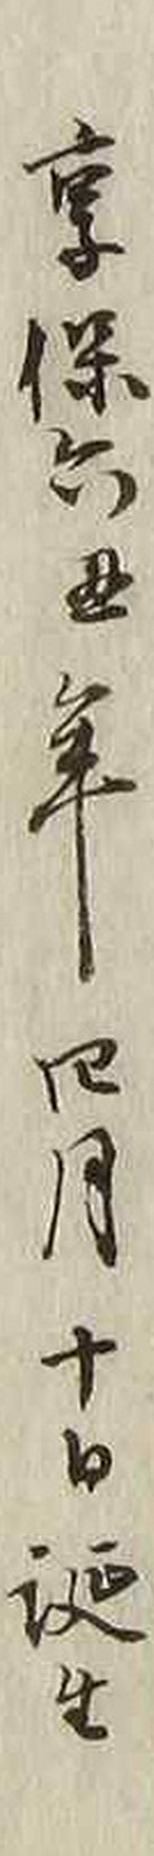享保六丑年四月十日誕生
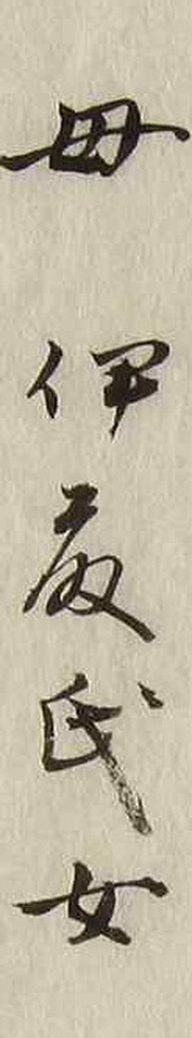母伊藤氏女
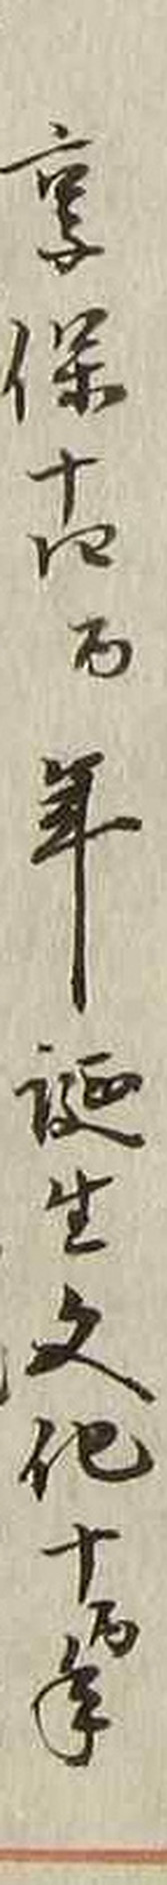享保十四酉年誕生文化十酉年
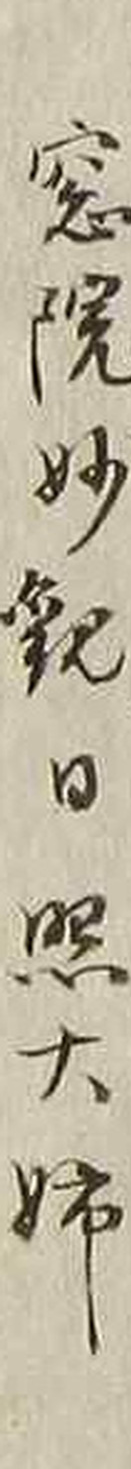秋窓院妙釋日照大姉
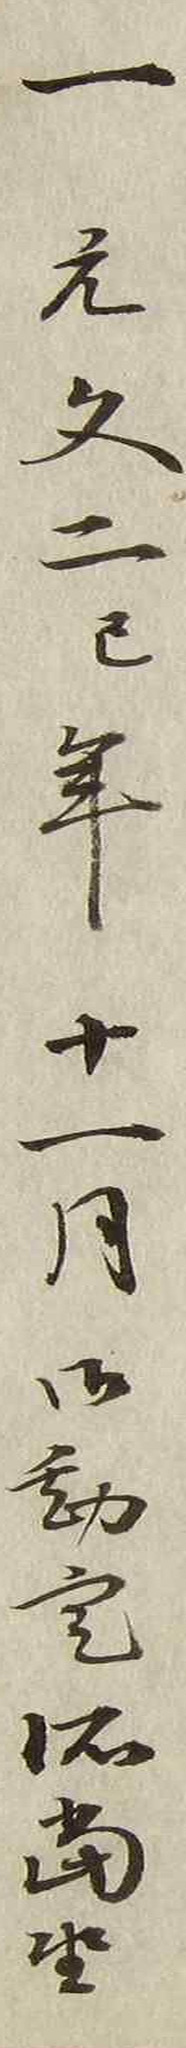一元文二巳年十一月御勘定所当座

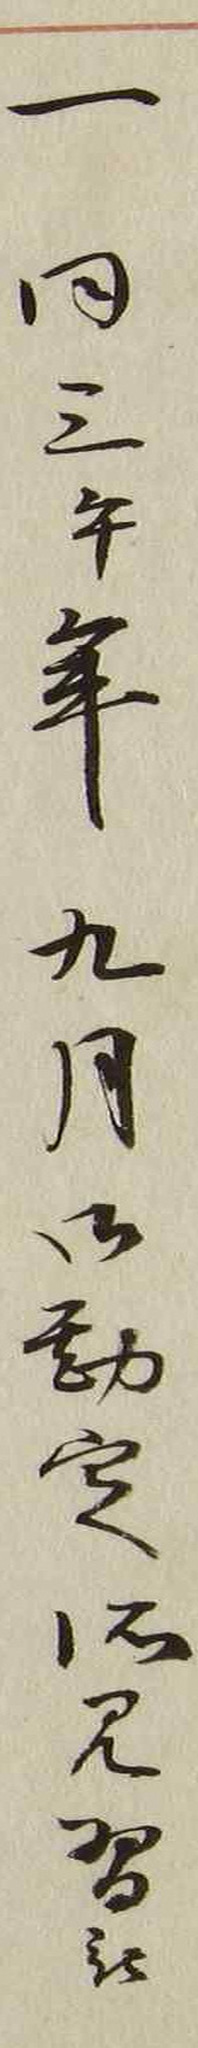一同三午年九月御勘定御見習
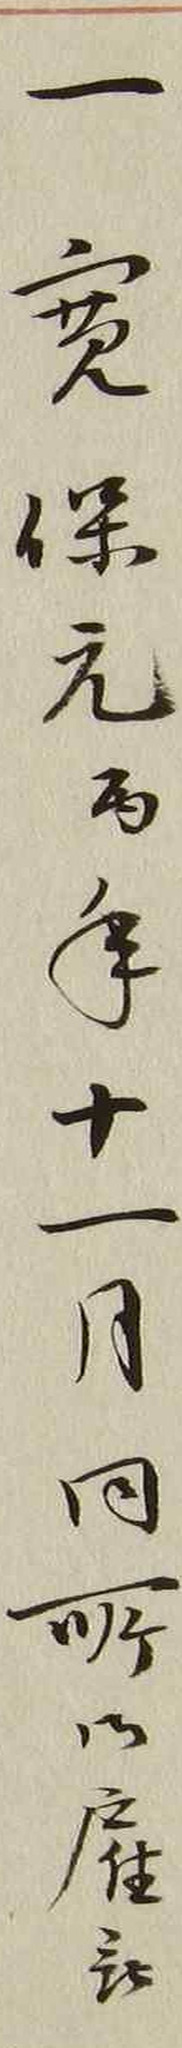一寛保元酉年十一月同所御雇い
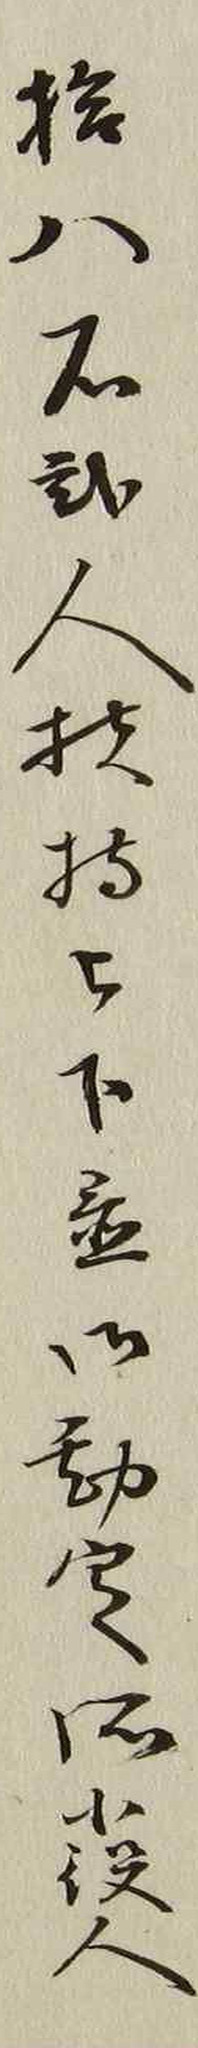拾八石弐人扶持下し置かれ御勘定所小役人
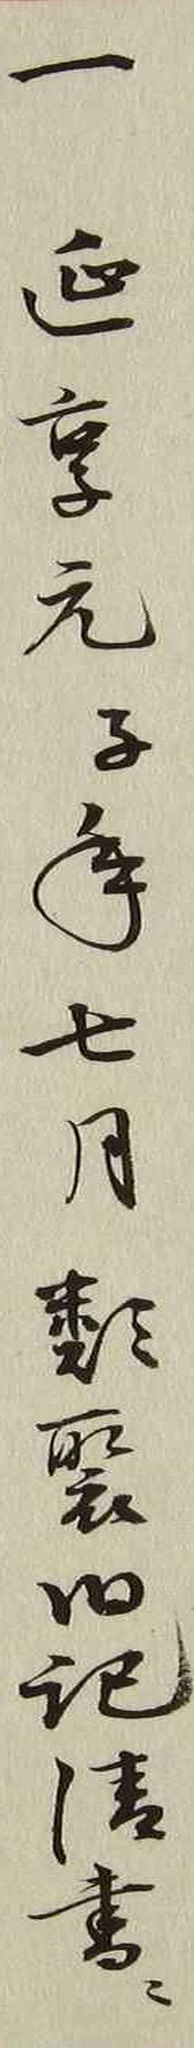一延享元子年七月類聚旧記清書ニ
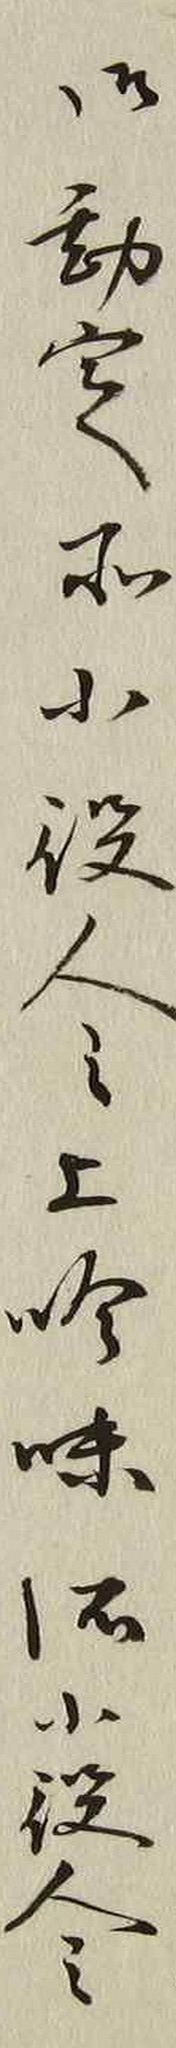御勘定所小役人之上吟味所小役人之
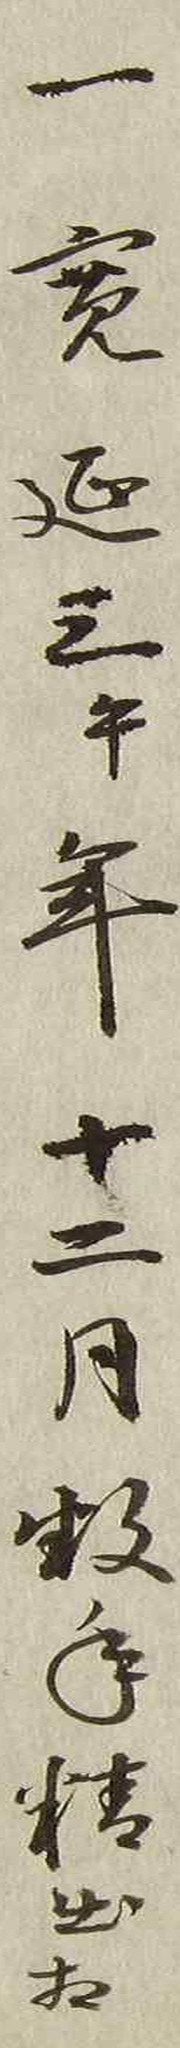一寛延三午年十二月数年精出相

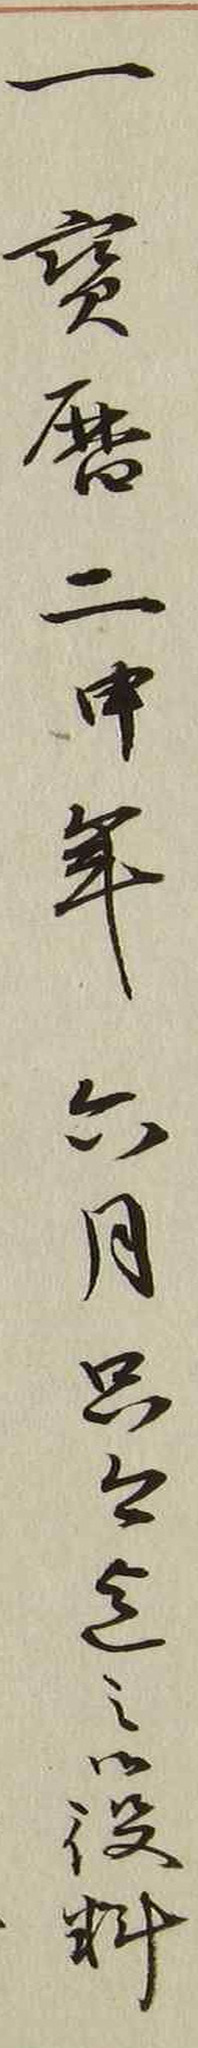一宝暦二申年六月只今迄之御役料
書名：諸士系譜　巻之16　い之部16
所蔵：会津若松市立会津図書館
